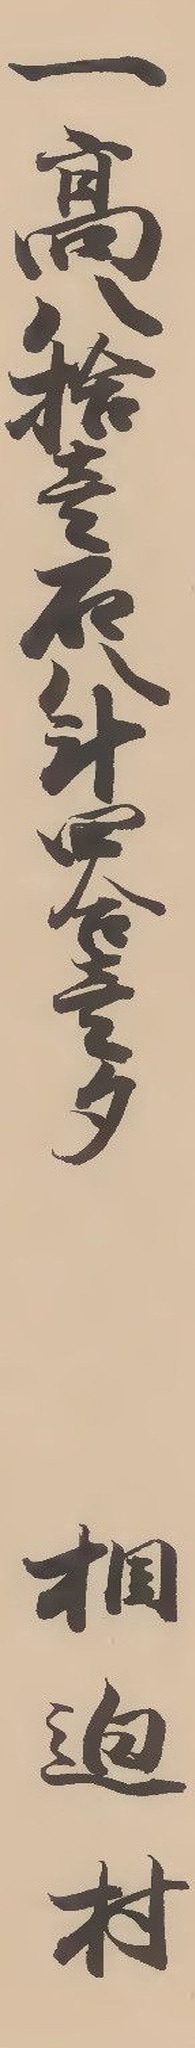一高八拾壱石八斗四合壱勺相迫村
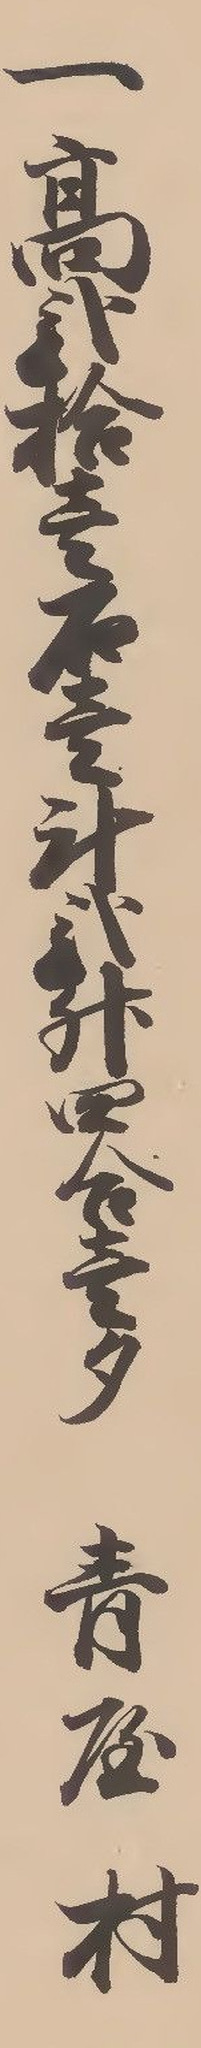一高弐拾壱石壱斗弐升四合壱勺青屋村
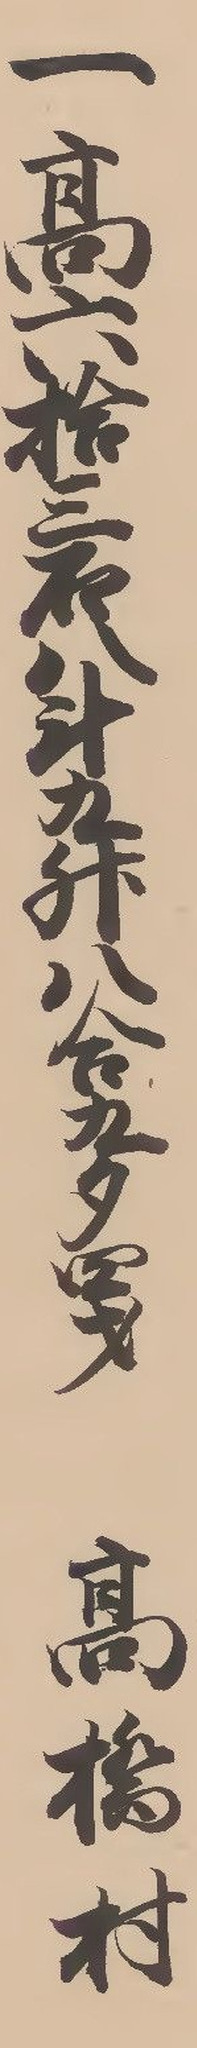一高六拾三石八斗九升八合九勺四才高橋村

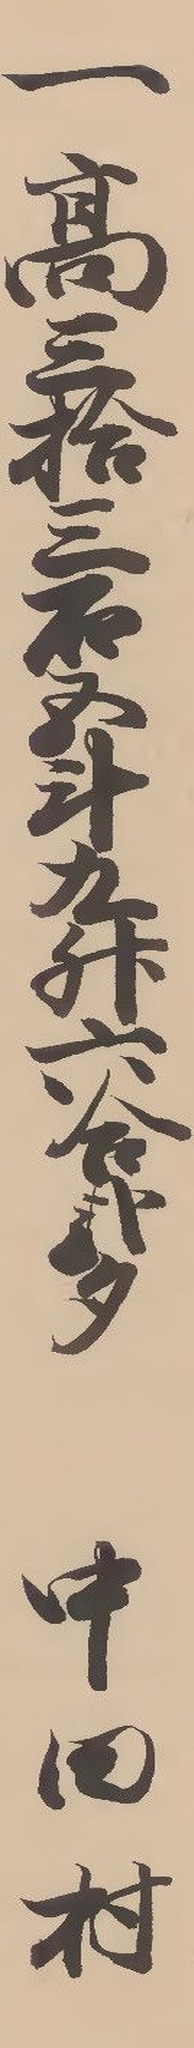一高三拾三石五斗九升六合弐勺中田村
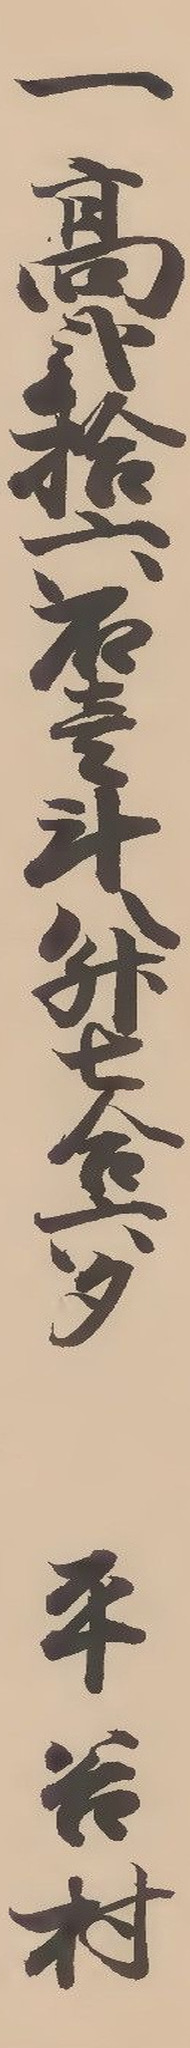一高弐拾六石壱斗八升七合六勺平谷村
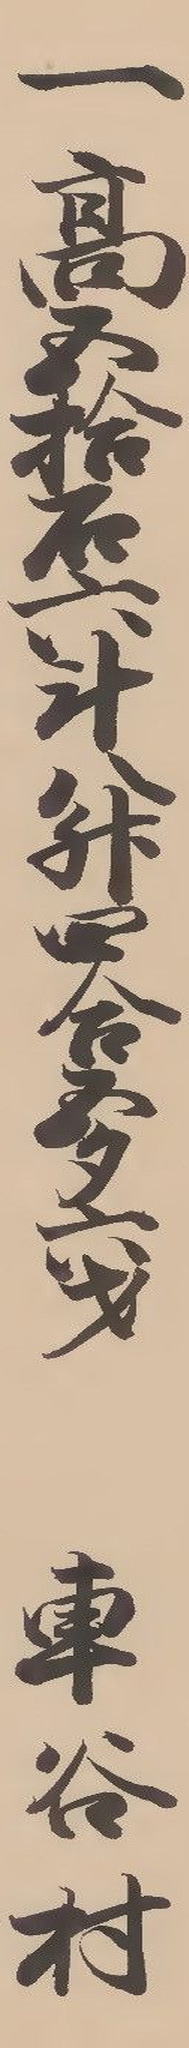一高五拾石六斗八升四合五勺六才車谷村
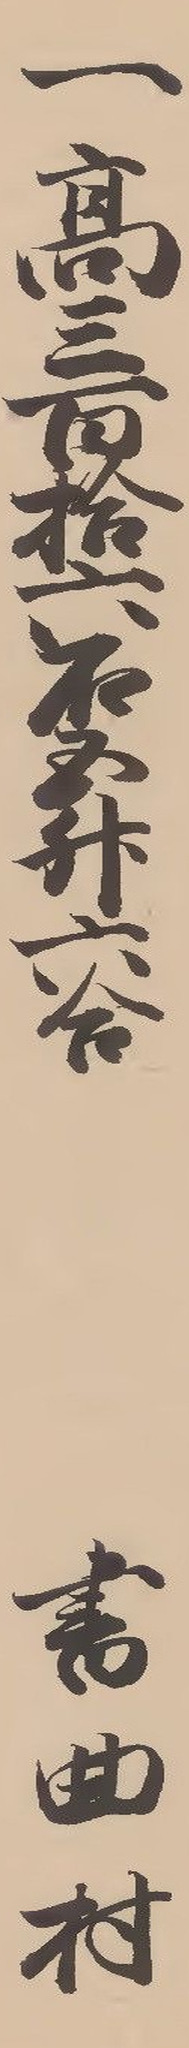一高三百拾六石五升六合書曲村
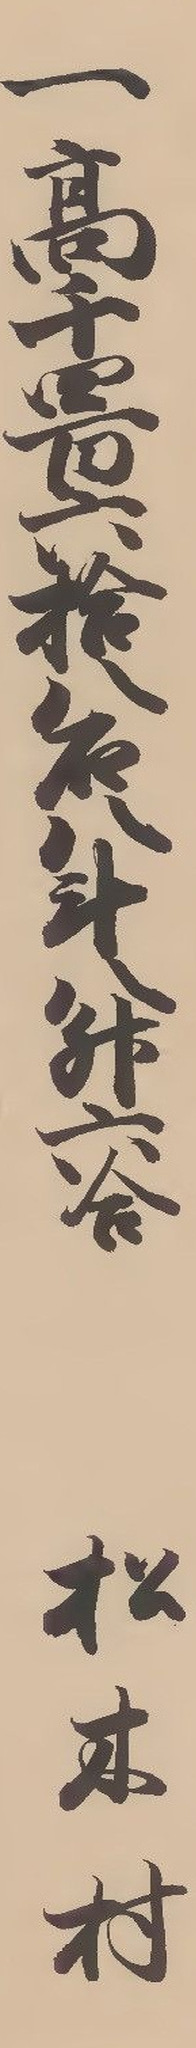一高千四百六拾八石八斗八升六合松木村
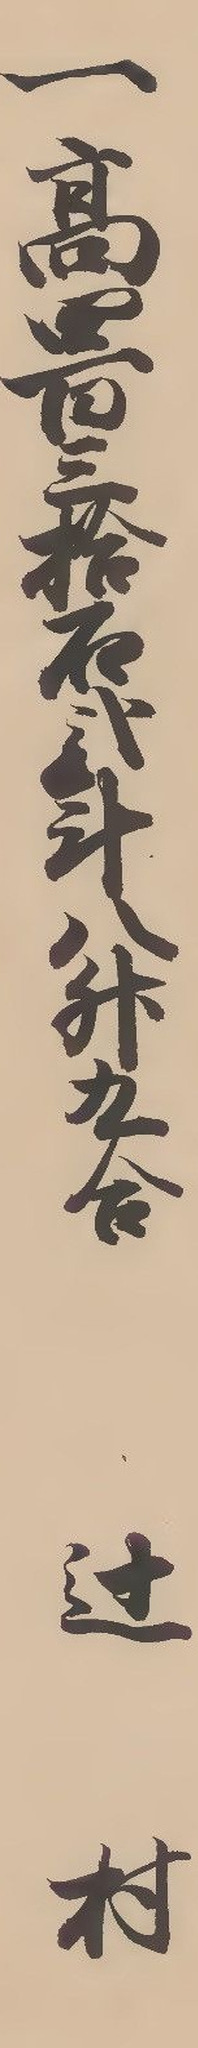一高四百三拾石弐斗八升九合辻村
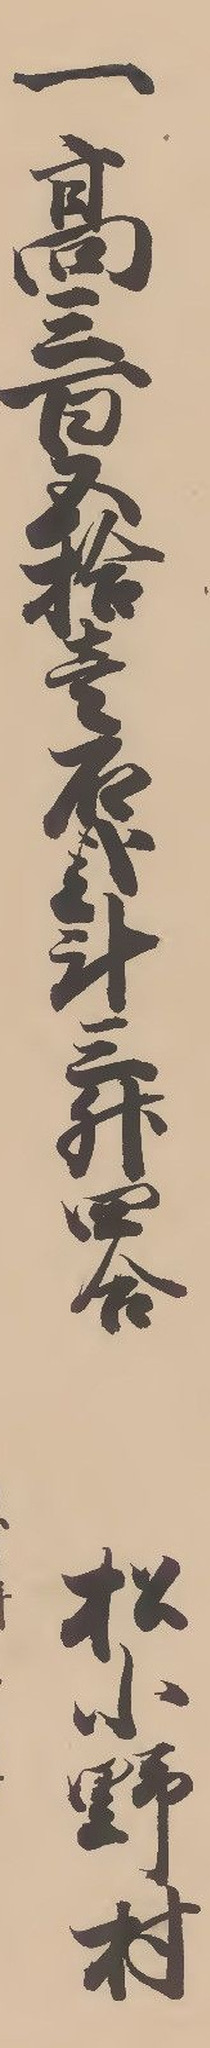一高三百五拾壱石弐斗三升四合松小野村

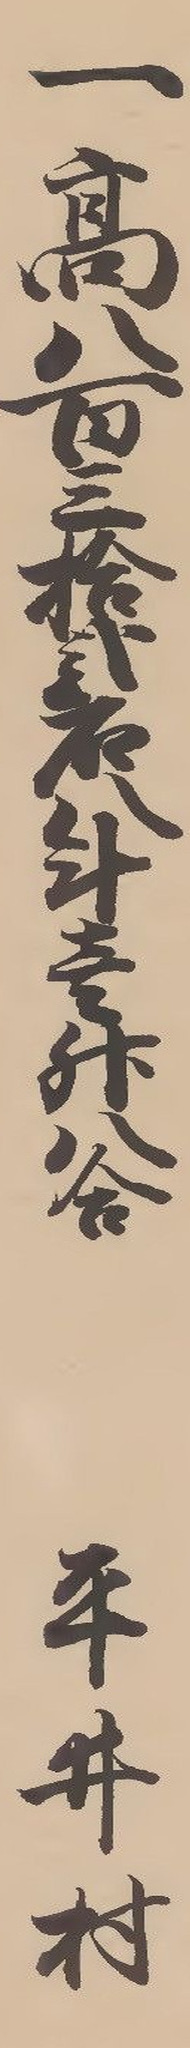一高八百三拾弐石八斗壱升八合平井村
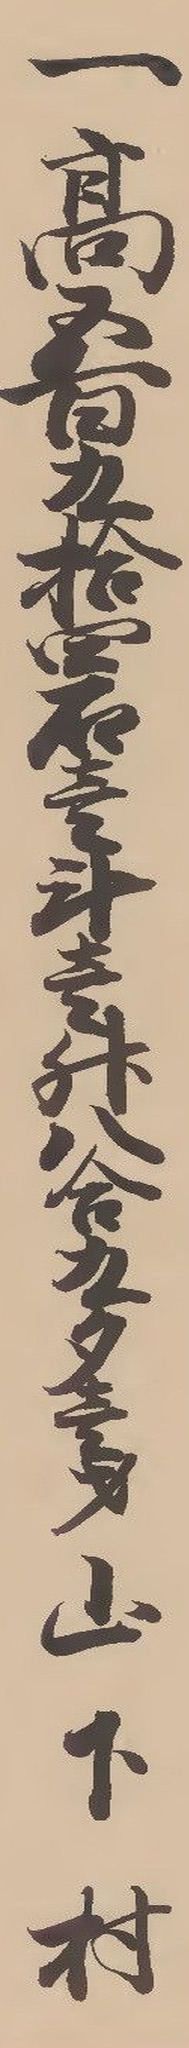一高五百九拾四石壱斗壱升八合九勺壱才山下村

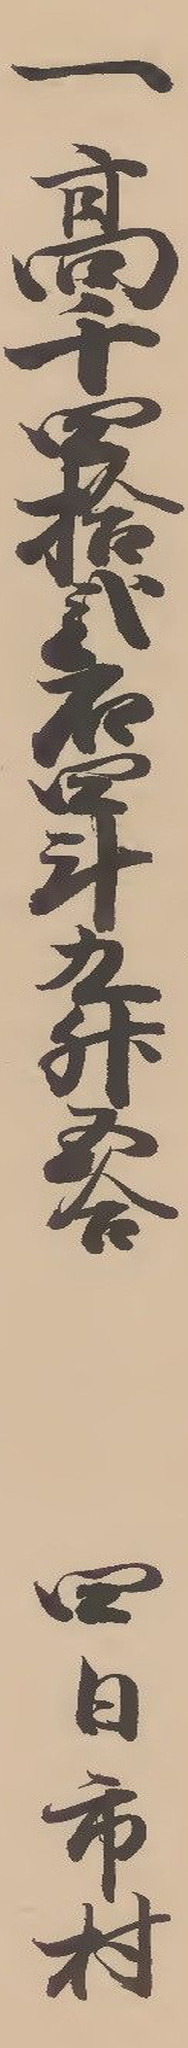一高千四拾弐石四斗九升五合四日市村
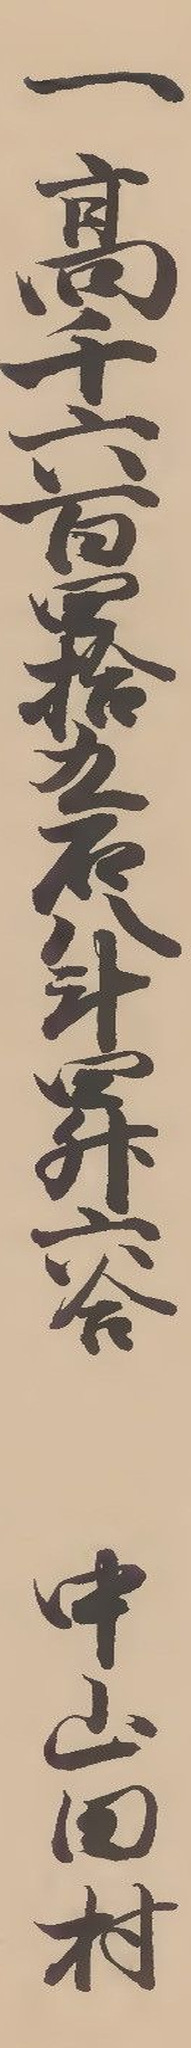一高千六百四拾九石八斗四升六合中山田村
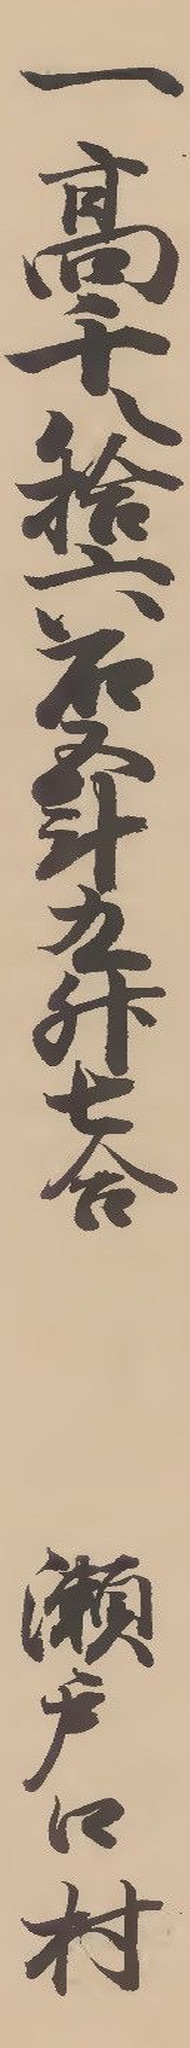一高千八拾六石五斗九升七合瀬戸口村
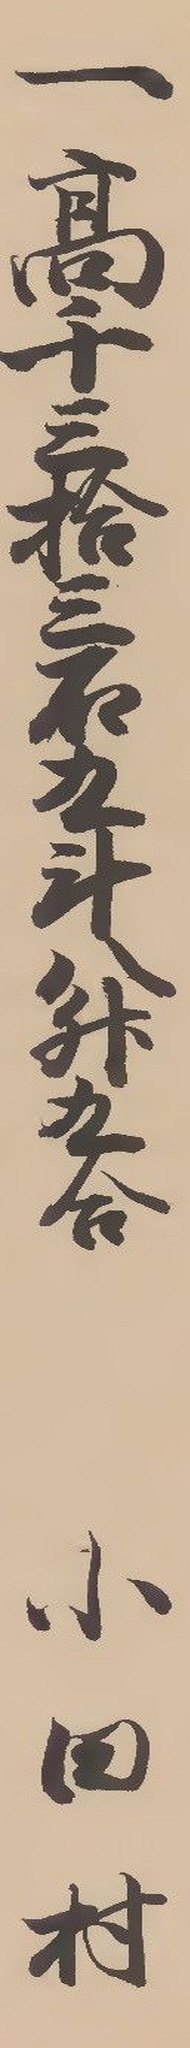一高千三拾三石九斗八升九合小田村
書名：豊後国郷帳
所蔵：国立公文書館 National Archives of Japan
